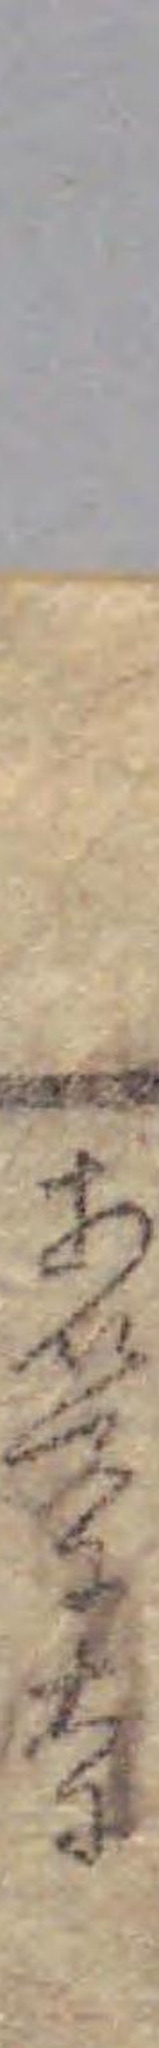あいてに大に
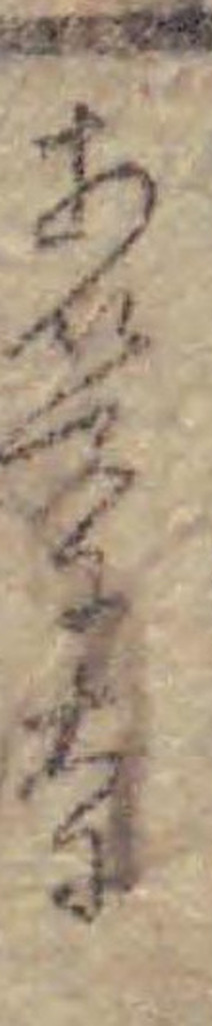あいてに大に
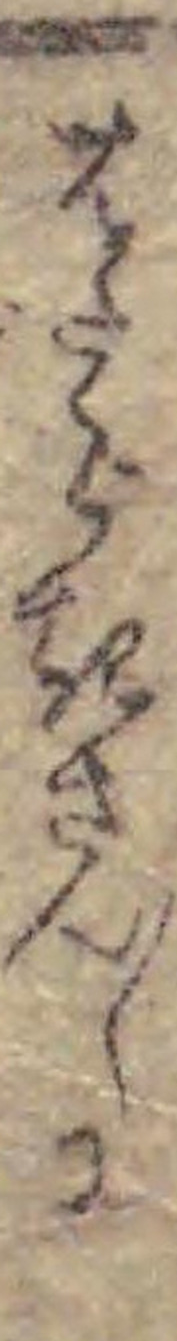はたらきさん〳〵に
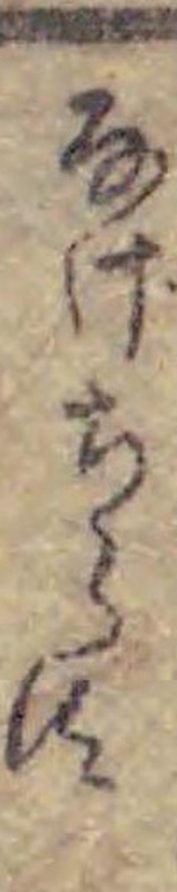なげちらす

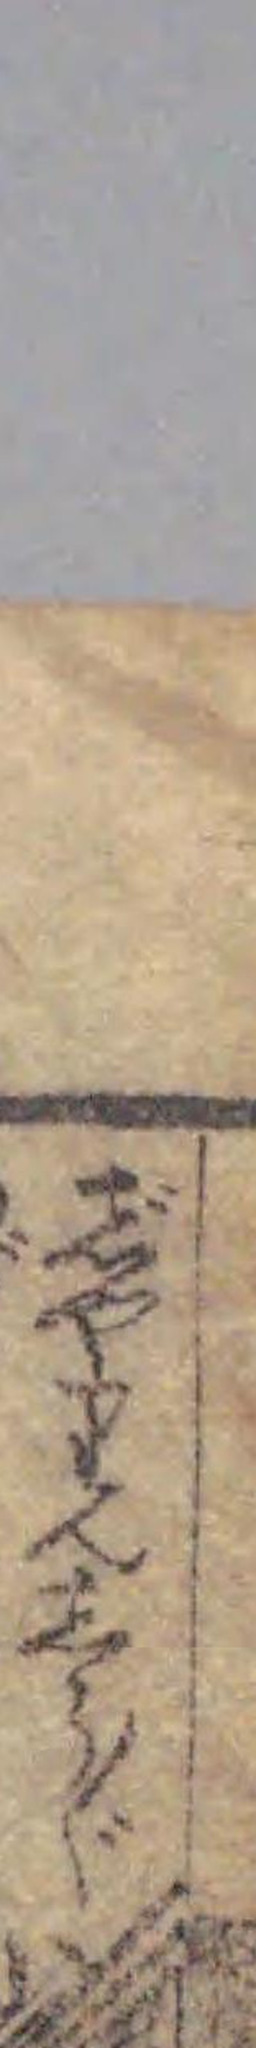じやりんしう〴〵
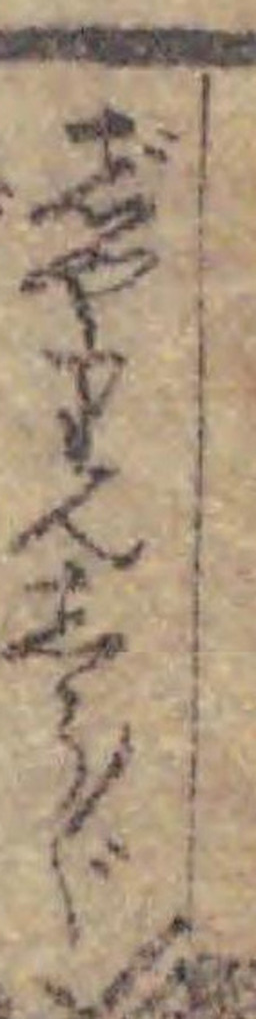じやりんしう〴〵
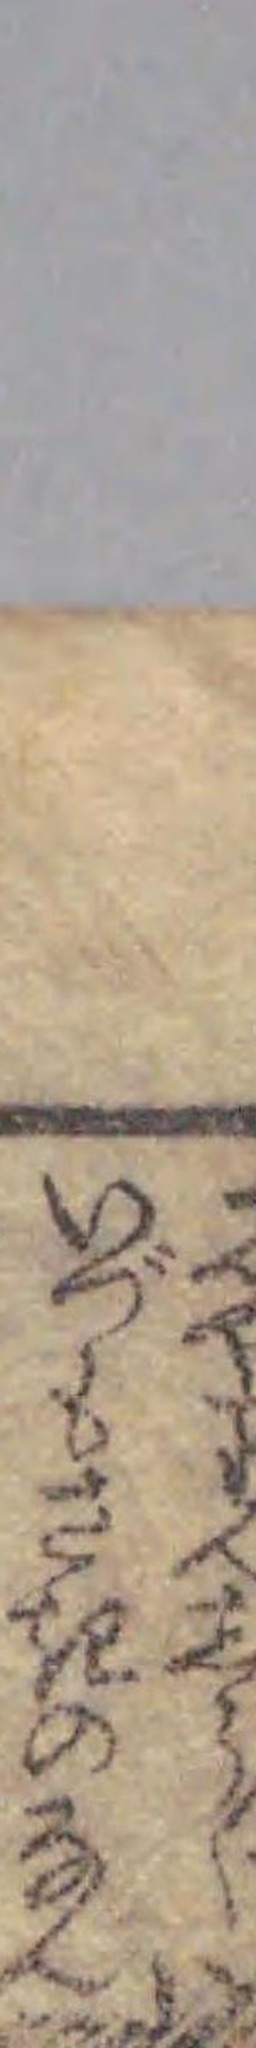いづもさきのなん
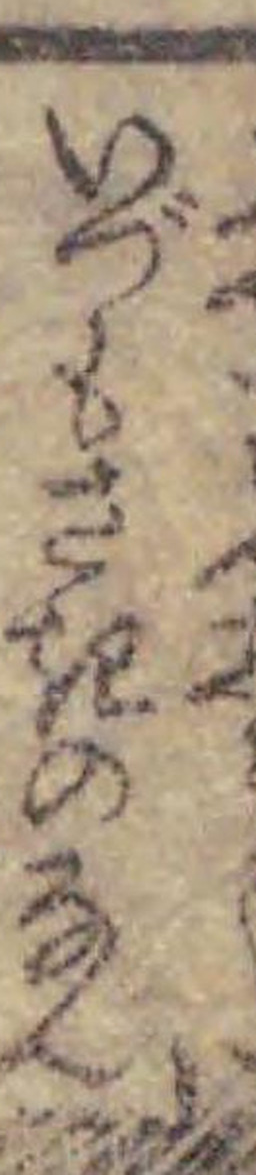いづもさきのなん
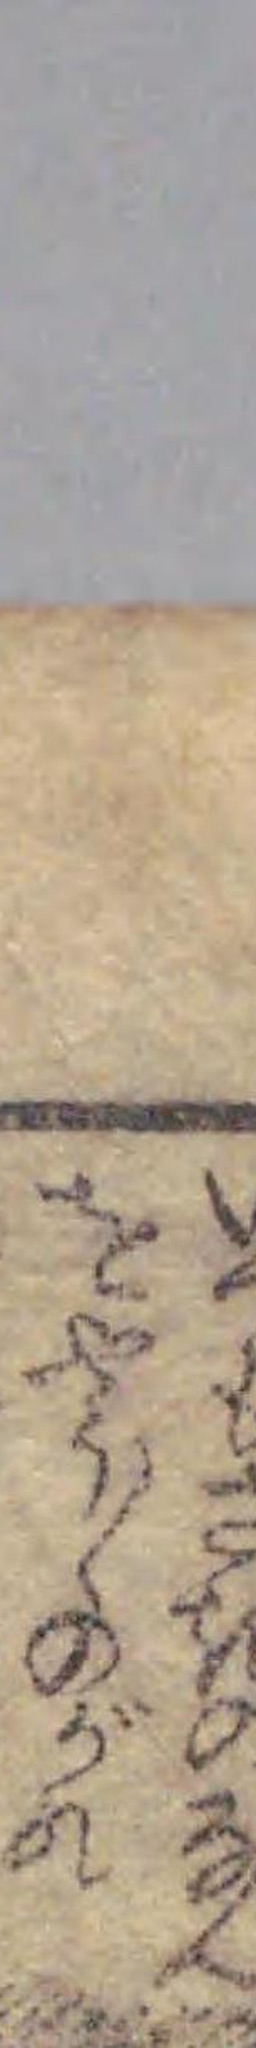をやう〳〵のがれ
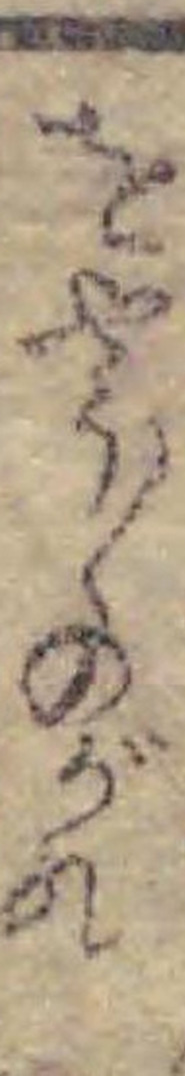をやう〳〵のがれ
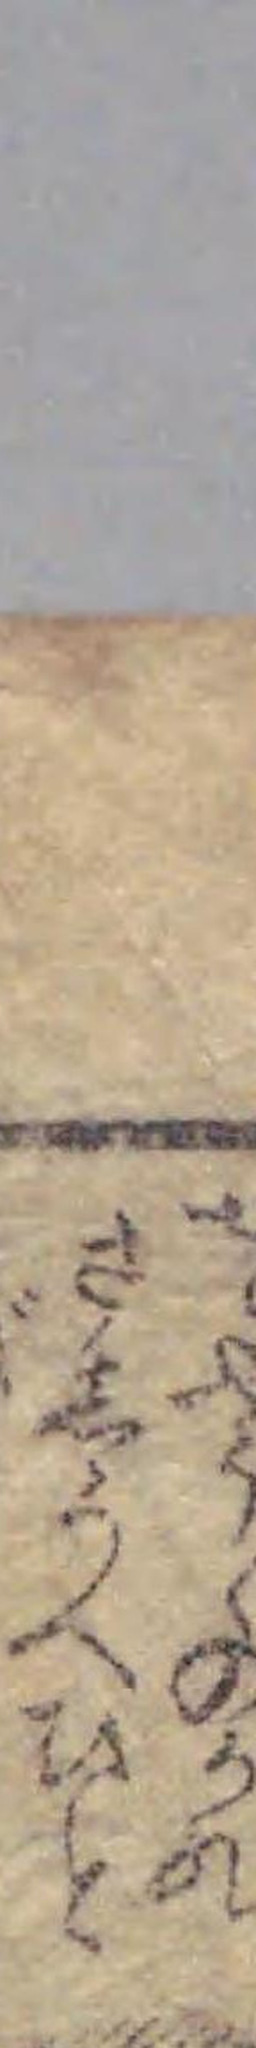さしうへひと
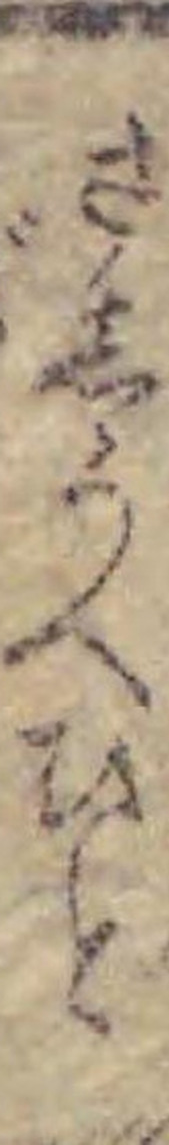さしうへひと
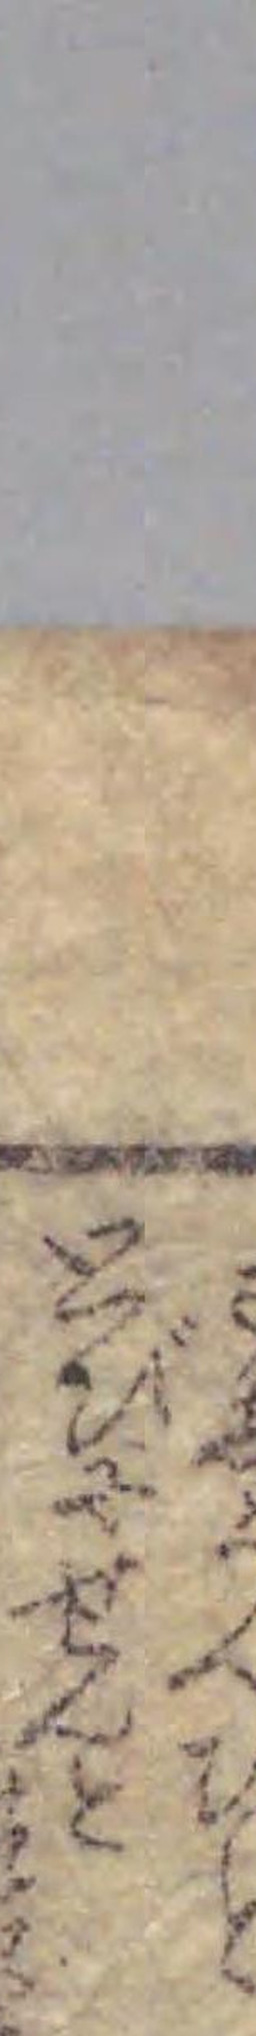とびにせんと
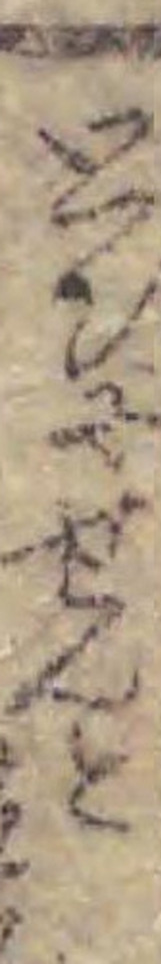とびにせんと
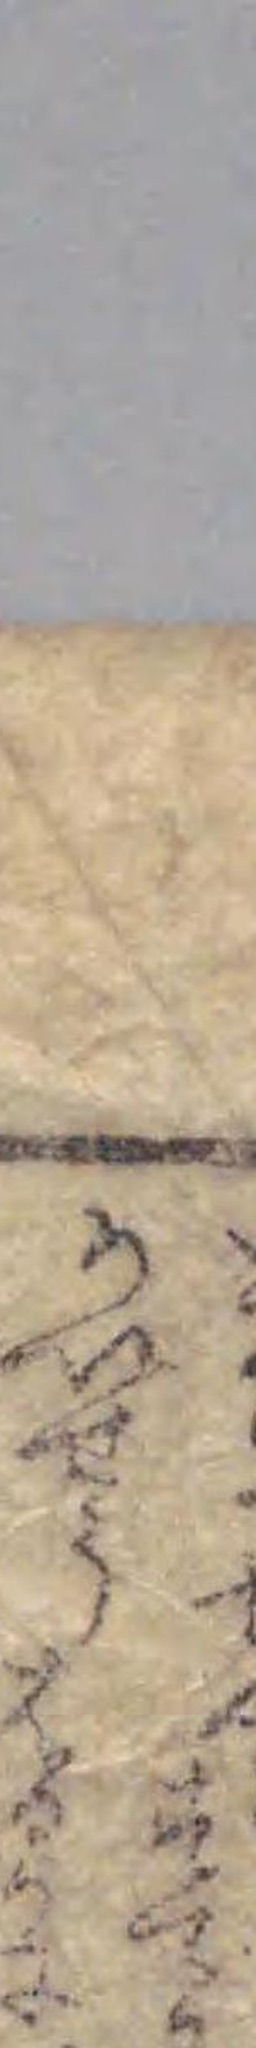かいせうはるかに
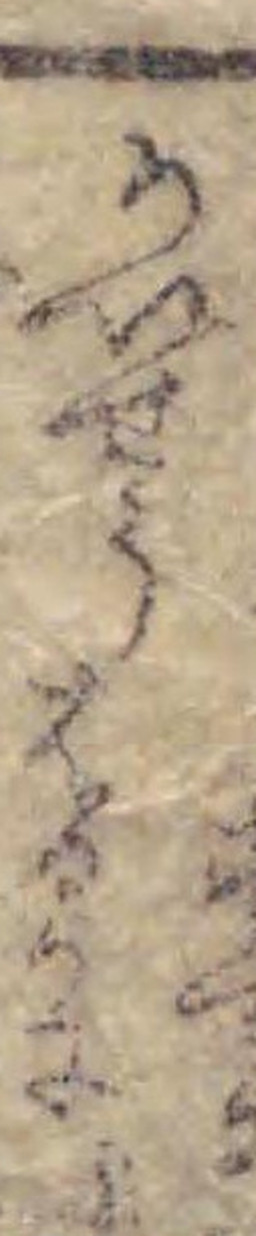かいせうはるかに
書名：化物世界夜半嵐 : 3巻
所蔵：国立国会図書館 National Diet Library, JAPAN
